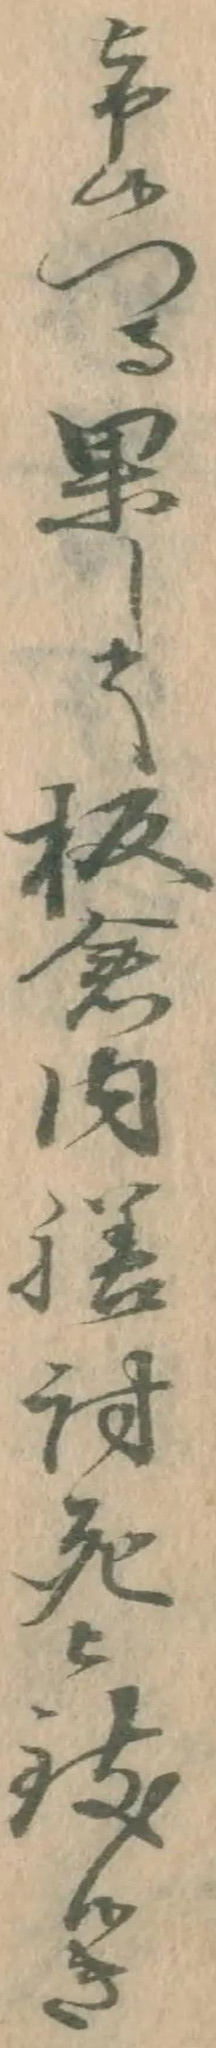被申候つる果して板倉内膳正討死被致候き

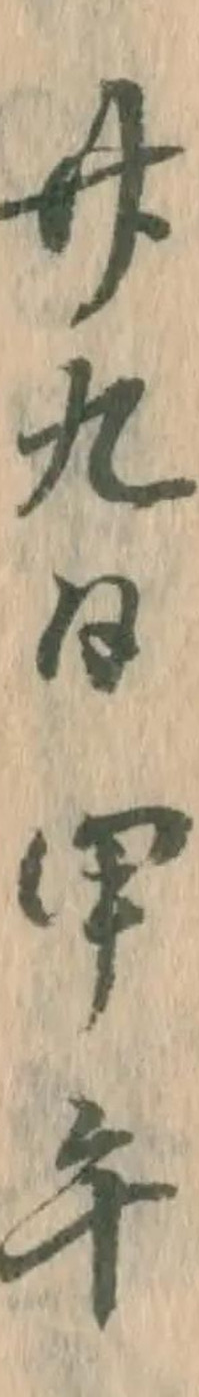廿九日甲午
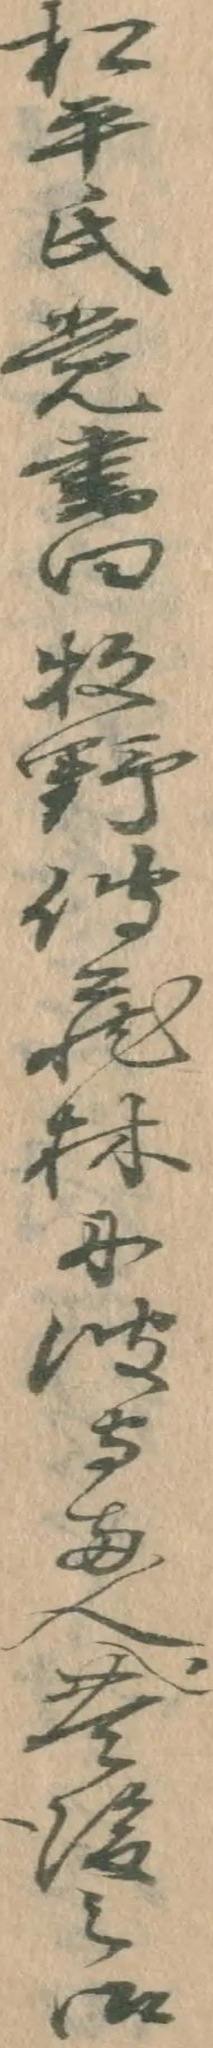松平氏覚書曰牧野伝蔵林丹波守両人豊後之御
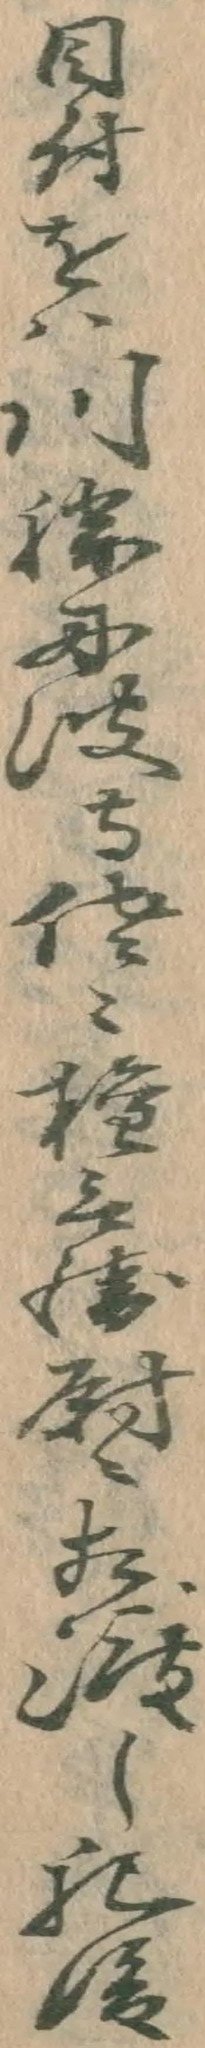目付をは川勝丹波守佐々権兵衛尉に相渡し肥後
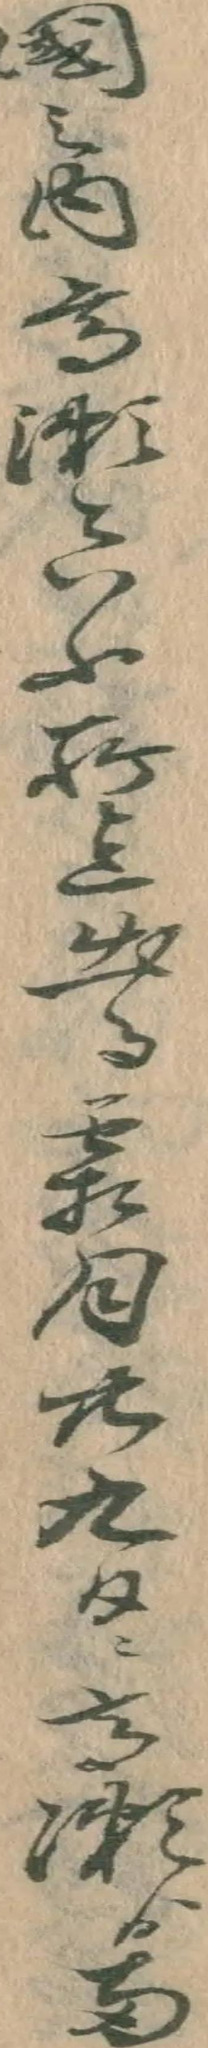国之内高瀬といふ所迄出る霜月廿九日に高瀬ゟ南
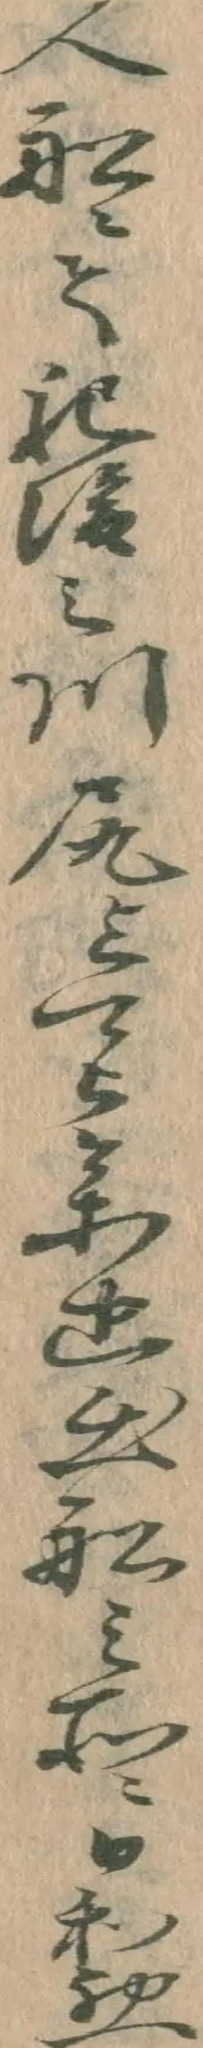人船にて肥後之川尻迄可被参迚出船之所に日和悪
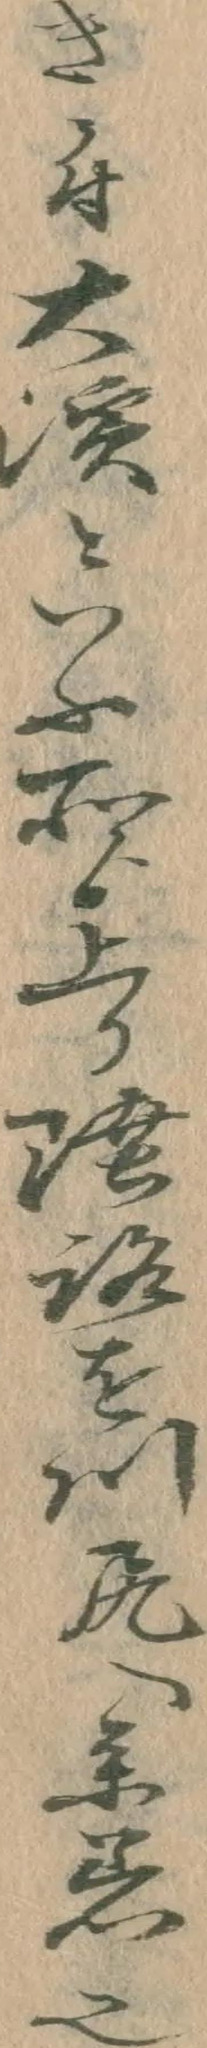きに付大浜といふ所ゟ上り陸路を川尻へ参着也
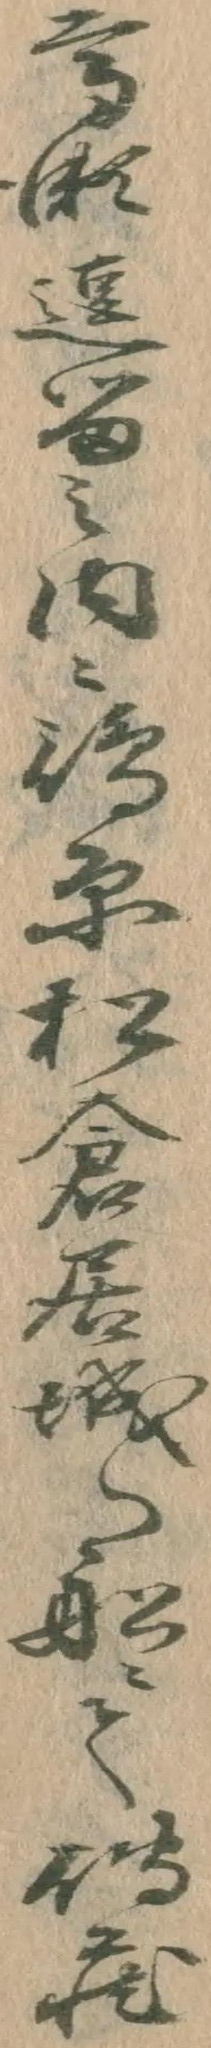高瀬逗留之内に島原松倉居城へ船にて伝蔵
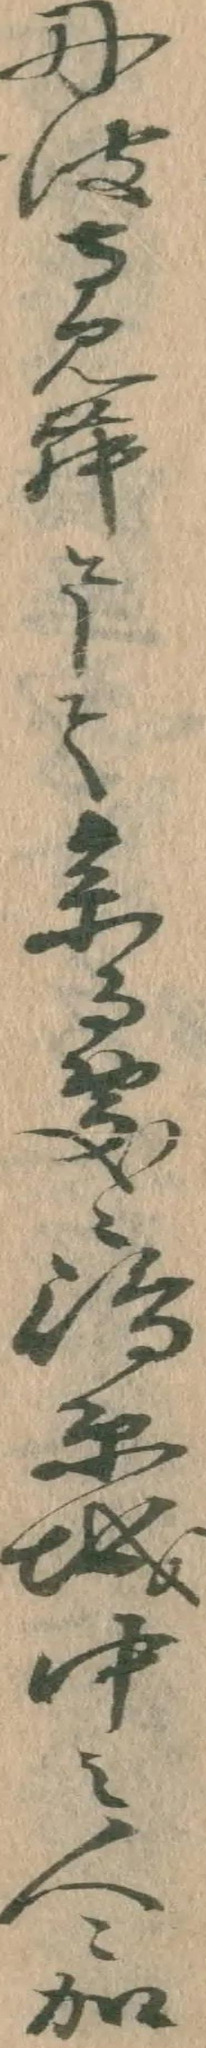丹波守見舞として参る処に島原城中之人々加
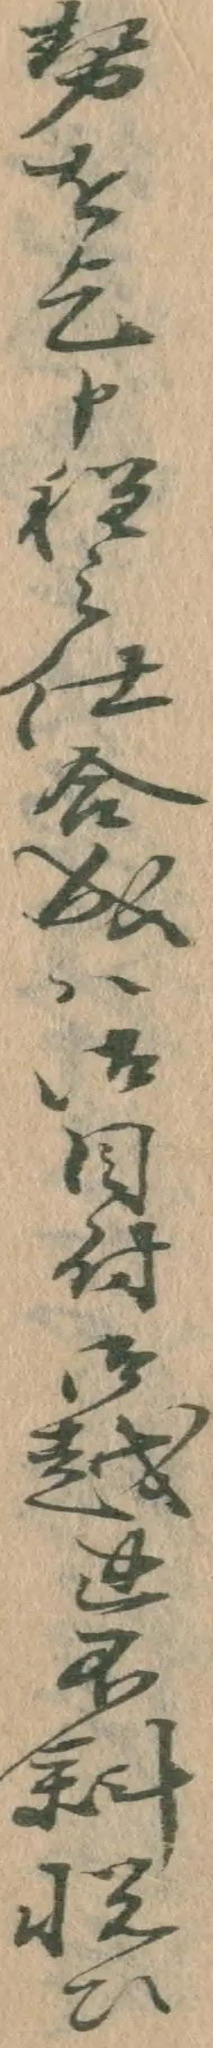勢を乞申程之仕合成は御目付御越迚不斜悦ひ
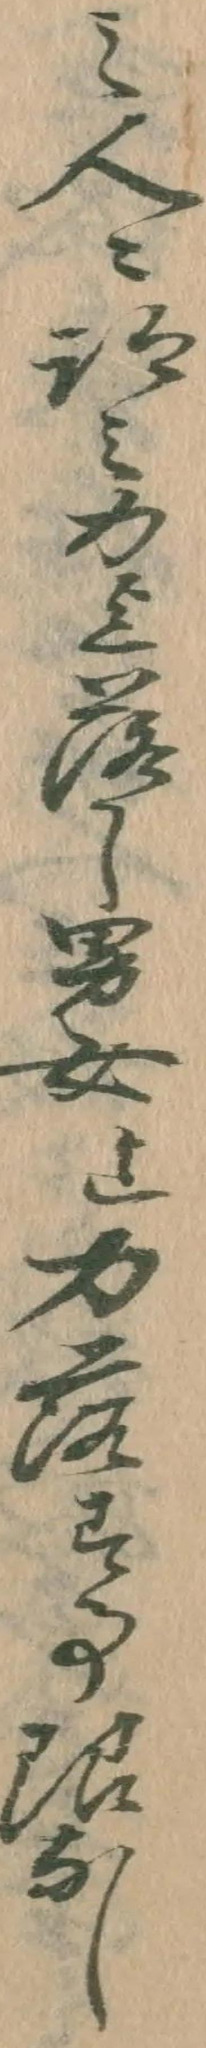之人々跡之力迄落し男女迄力落する限なし
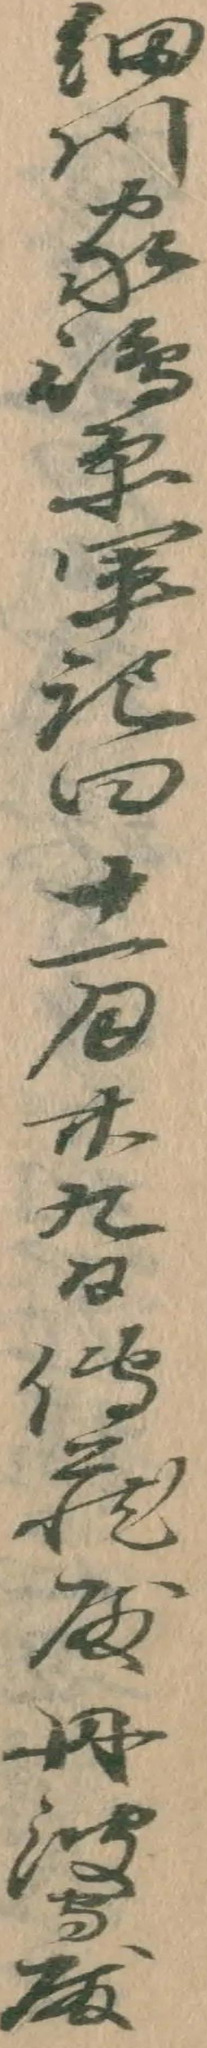細川家島原軍記曰十一月廿九日伝蔵殿丹波守殿
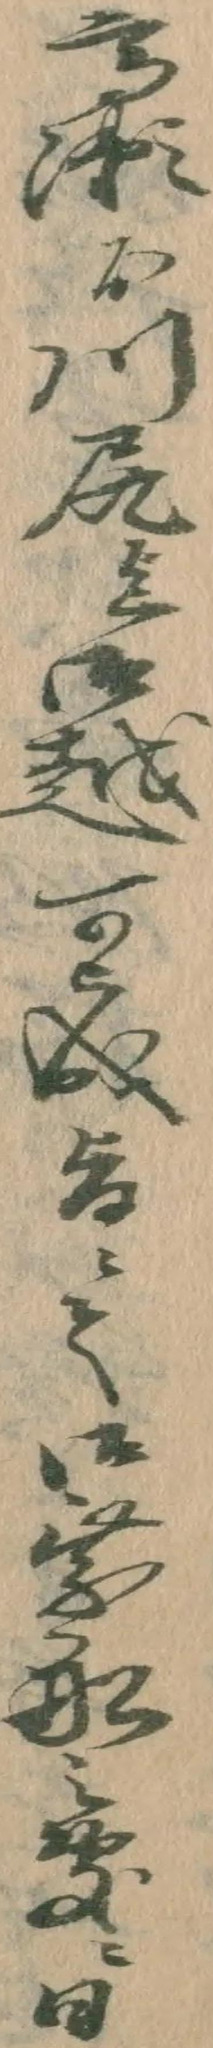高瀬ゟ川尻迄御越可被成旨にて御乗船之処に日
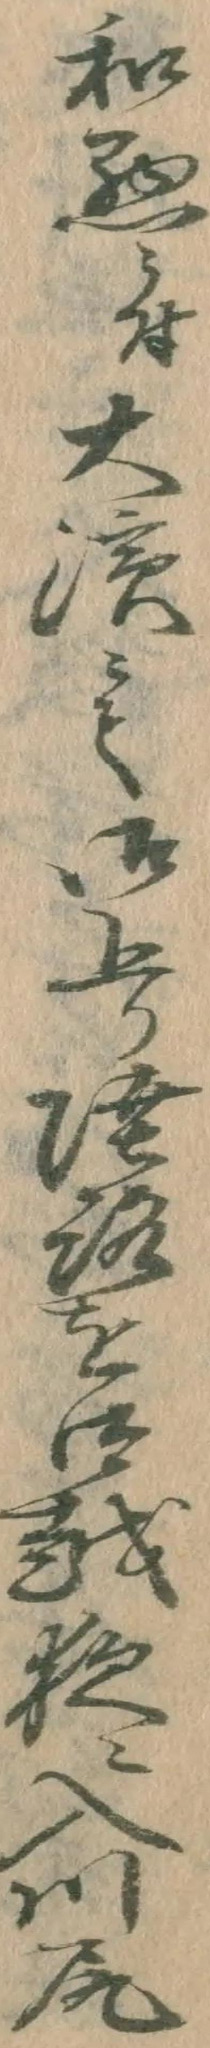和悪に付大渡にて御上り陸路を御越夜に入川尻
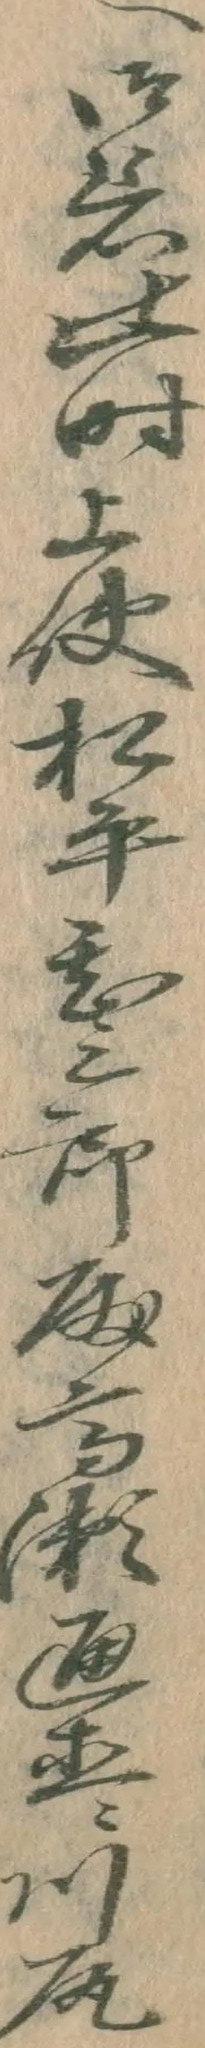へ御着此時上使松平甚三郎殿高瀬通直に川尻
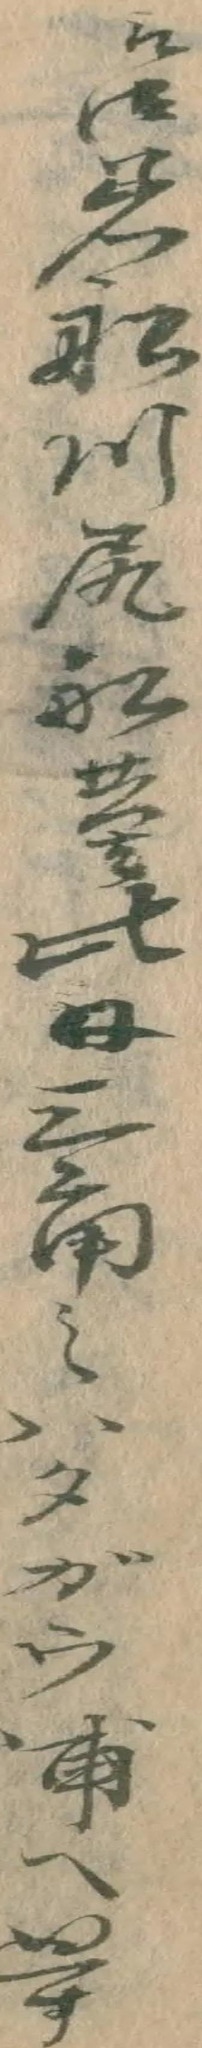江御着船川尻船共は此日三角之ハタガウ浦へ廻す
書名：切支丹御退治記 49巻. [3]
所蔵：国立国会図書館 National Diet Library, JAPAN
